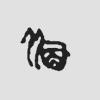弼
